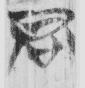君
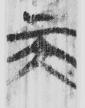天
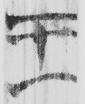王
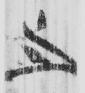之
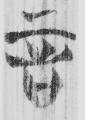言
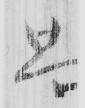也
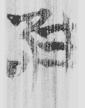唯
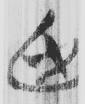臣
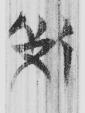死
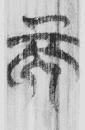而
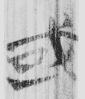或
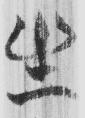生
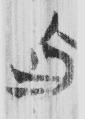此
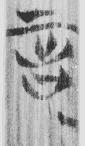言
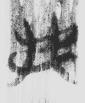弗
